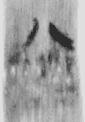八
